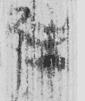邦
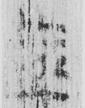者
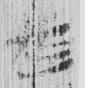必
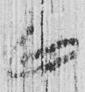㠯（以）
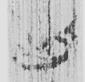此
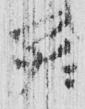孔子
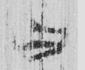曰
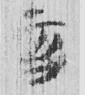言
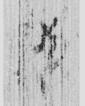則
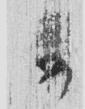𡵂（美）
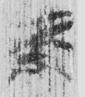矣
